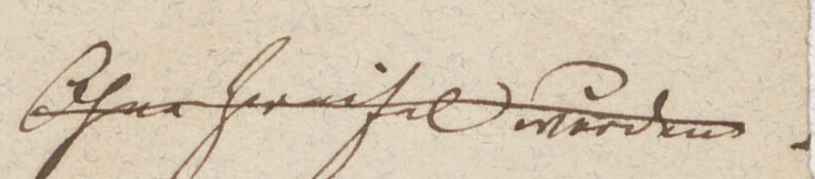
Ohne Zweifel wurden
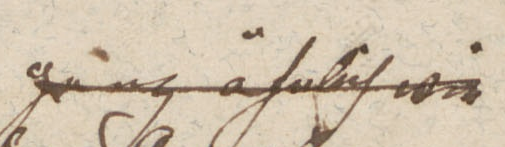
ganz ähnlich wie
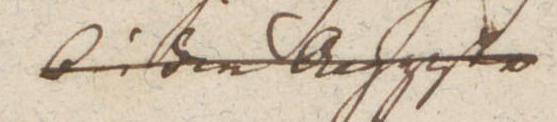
bei den Aegypte
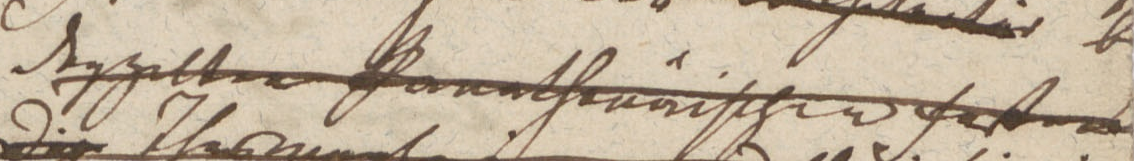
doppelten Panathenäischen Festen
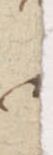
die
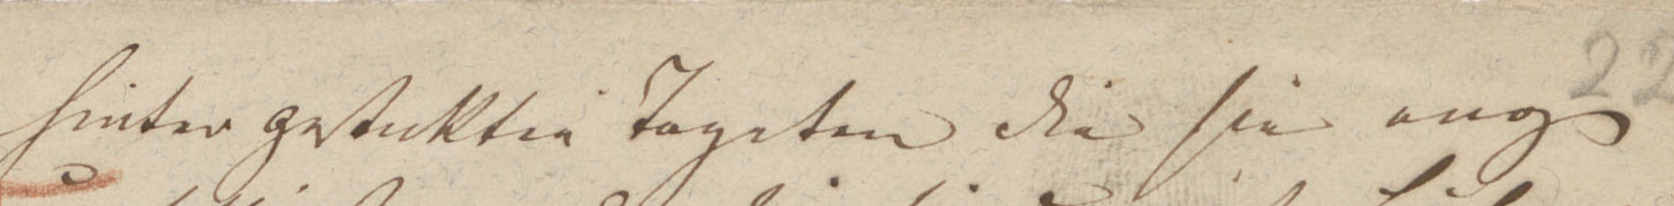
hinter gestickten Tapeten die sie eng
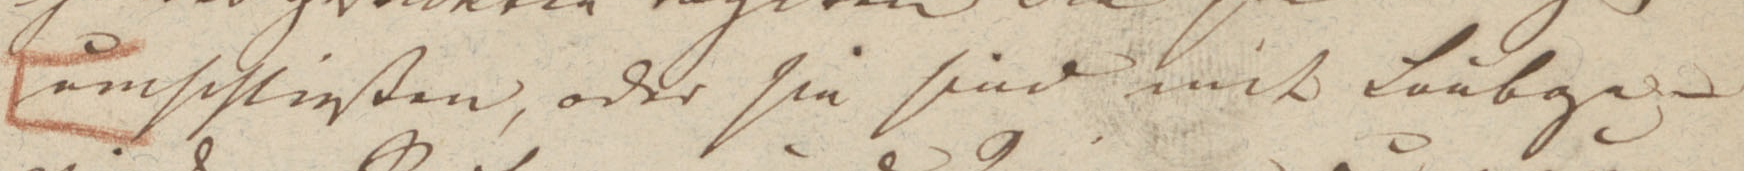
umschliessen, oder sie sind mit Laubge-
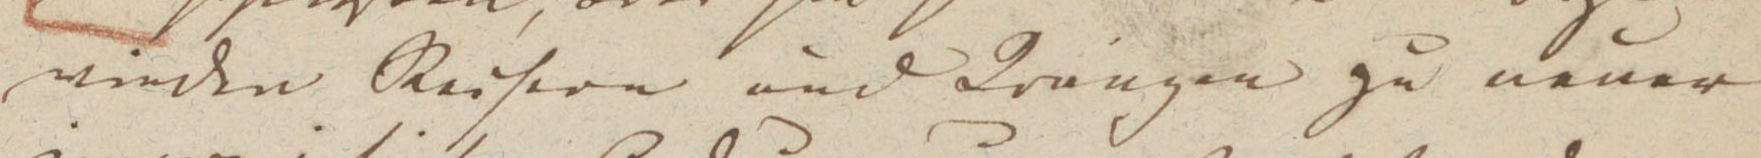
winden Reisern und Kränzen zu neuer
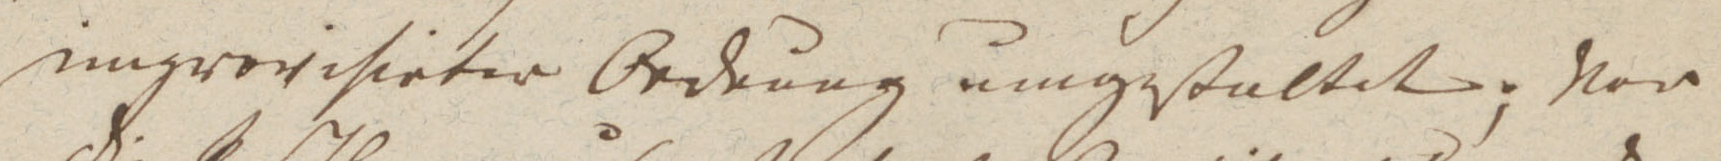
improvisirter Ordnung umgestaltet; Vor
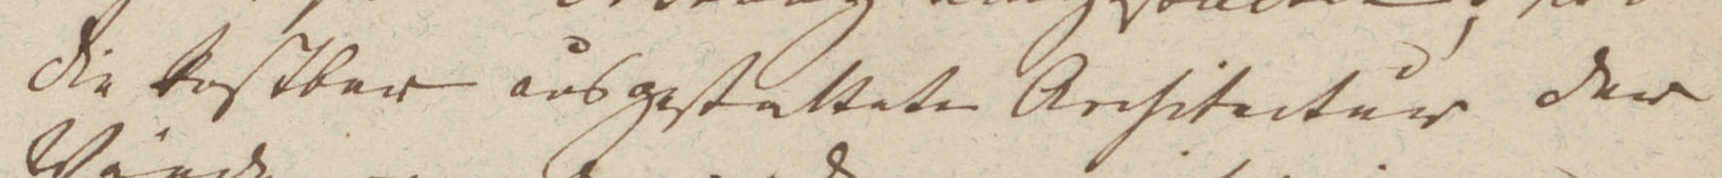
die kostbar ausgestaltete Architectur der
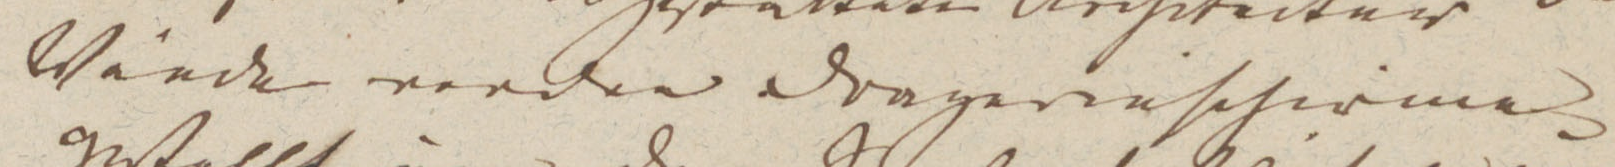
Wände werden Draperieschirme
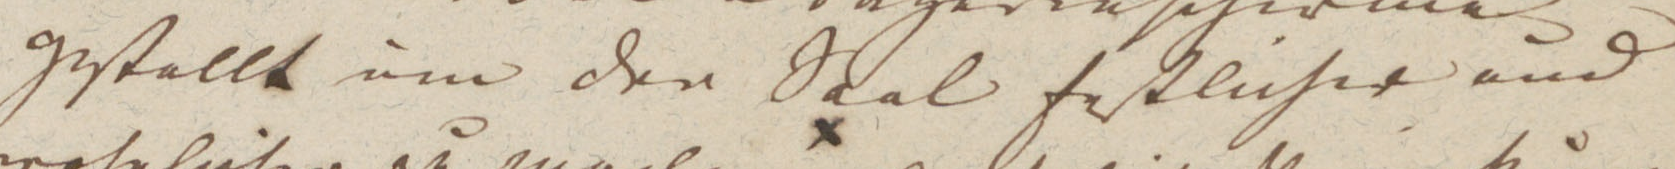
gestellt um den Saal festlicher und
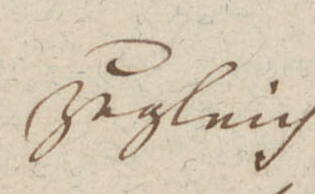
zugleich
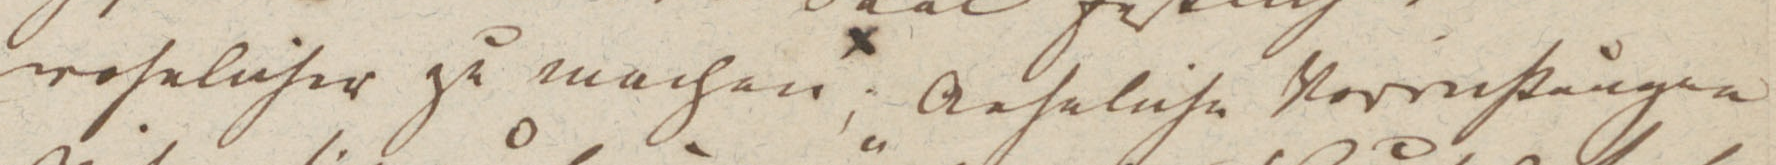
wohnlicher zu machen;% Aehnliche Vorrichtungen
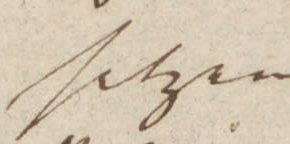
setzen
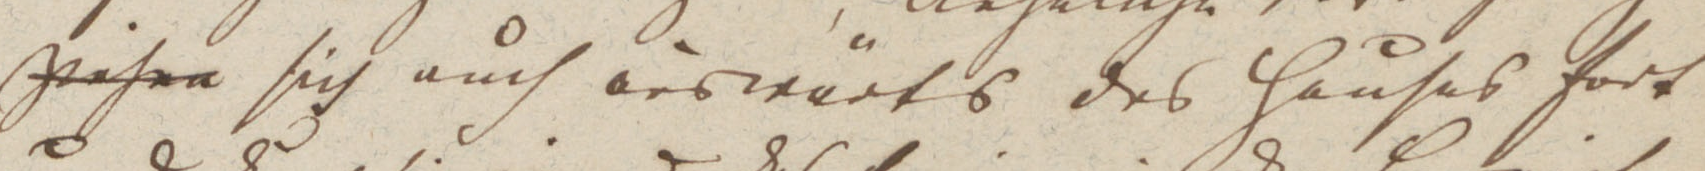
ziehen sich auch auswärts des Hauses fort
